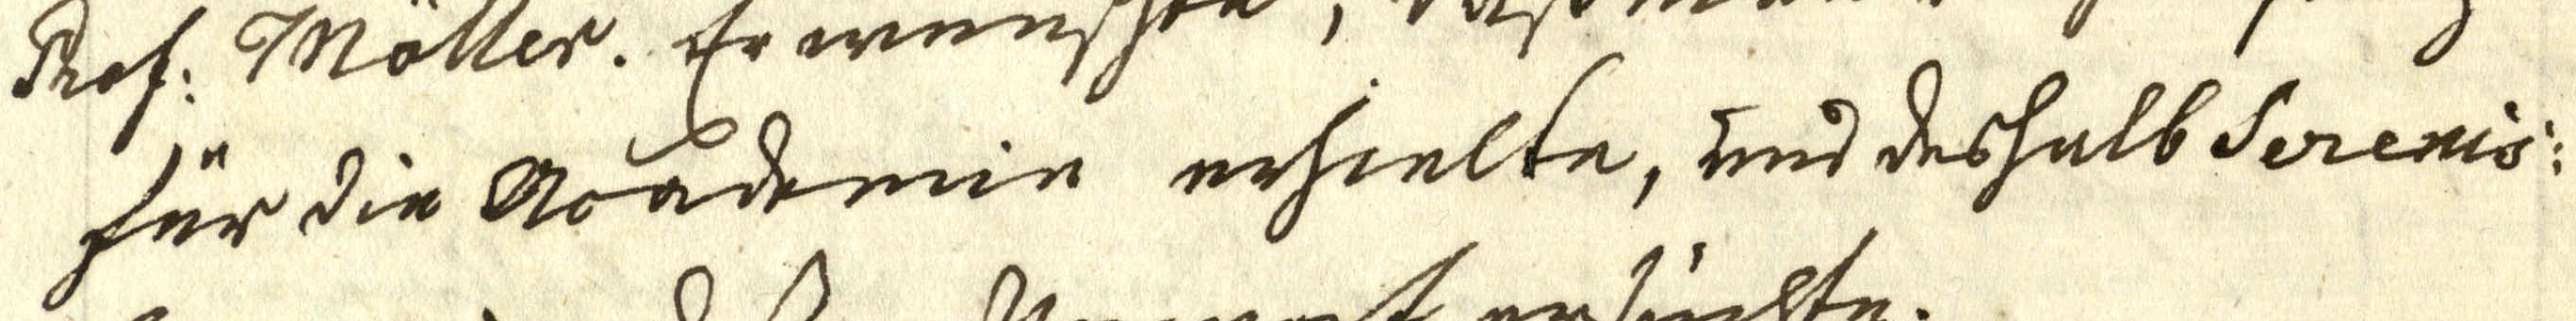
für die Academie erhielte, und deshalb Serenis¬
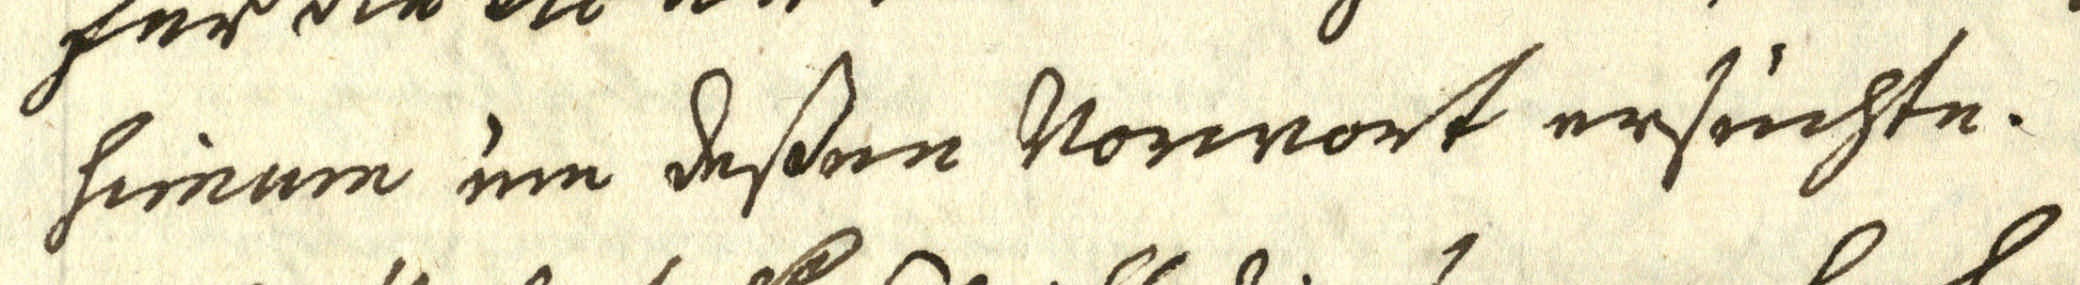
simum um deßen Vorwort ersuchte.
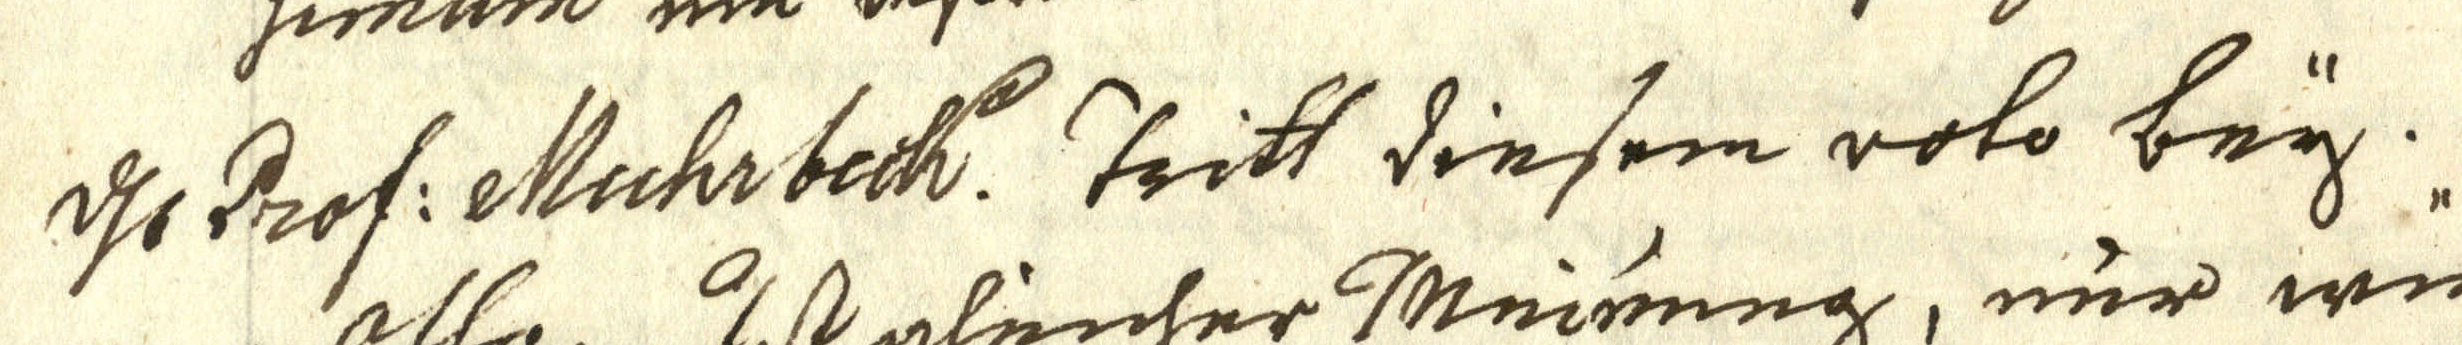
dh Prof. Muhrbeck. Tritt diesem voto beÿ.
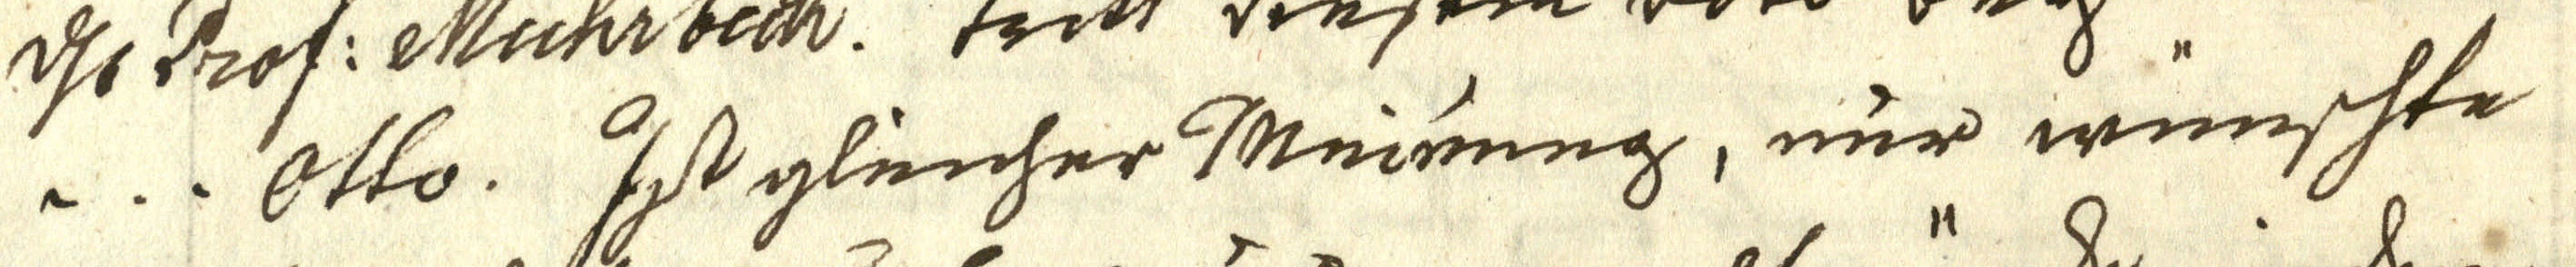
Otto. Ist gleicher Meinung, nur wünschte
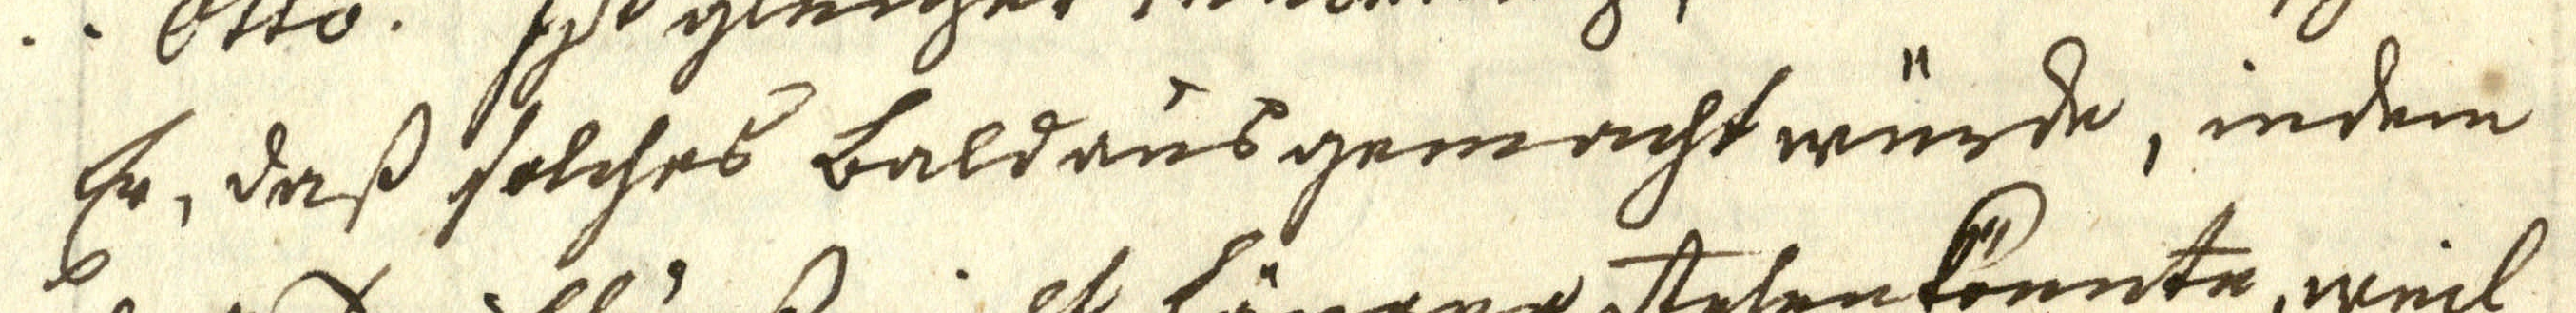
Er, daß solches bald aus gemacht würde, indem
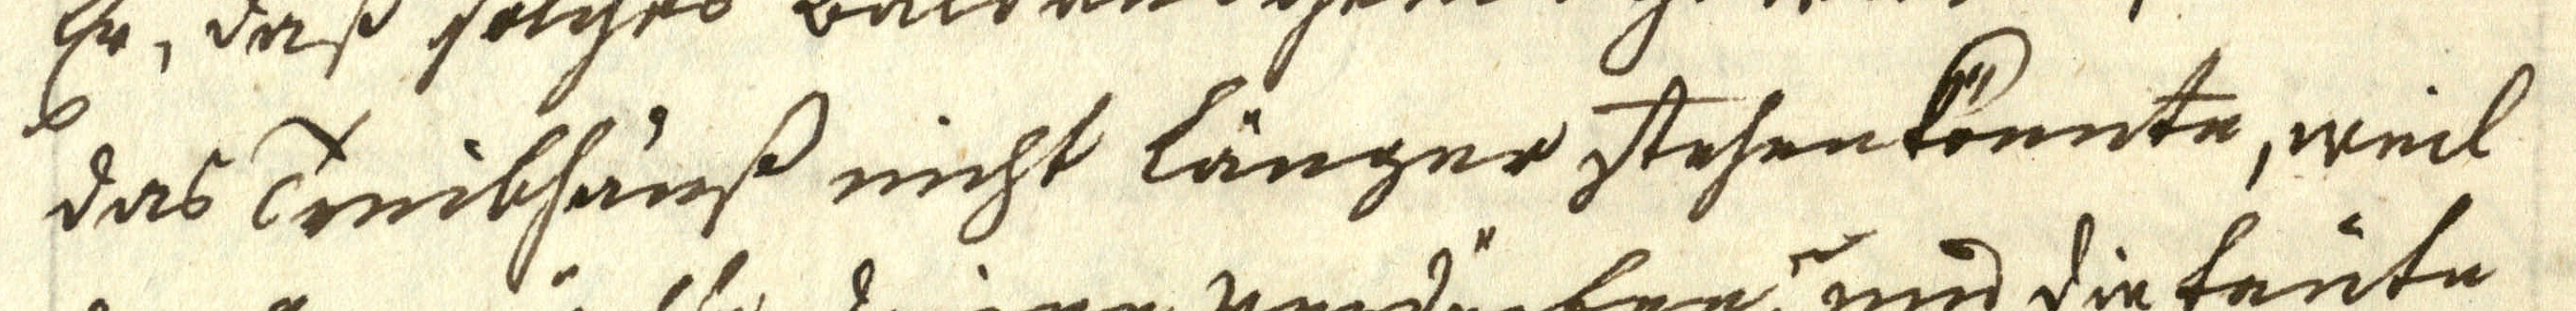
das Treibhauß nicht länger stehen könnte, weil
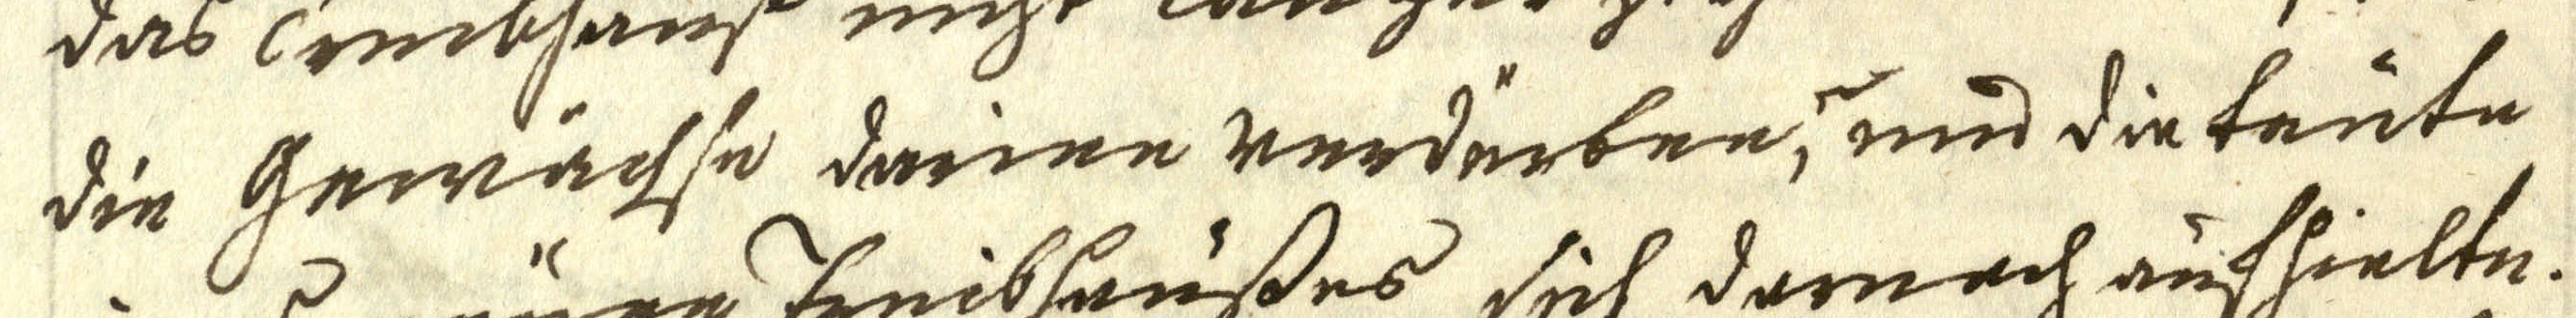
die Gewächse darinn verdärben, und die Baute
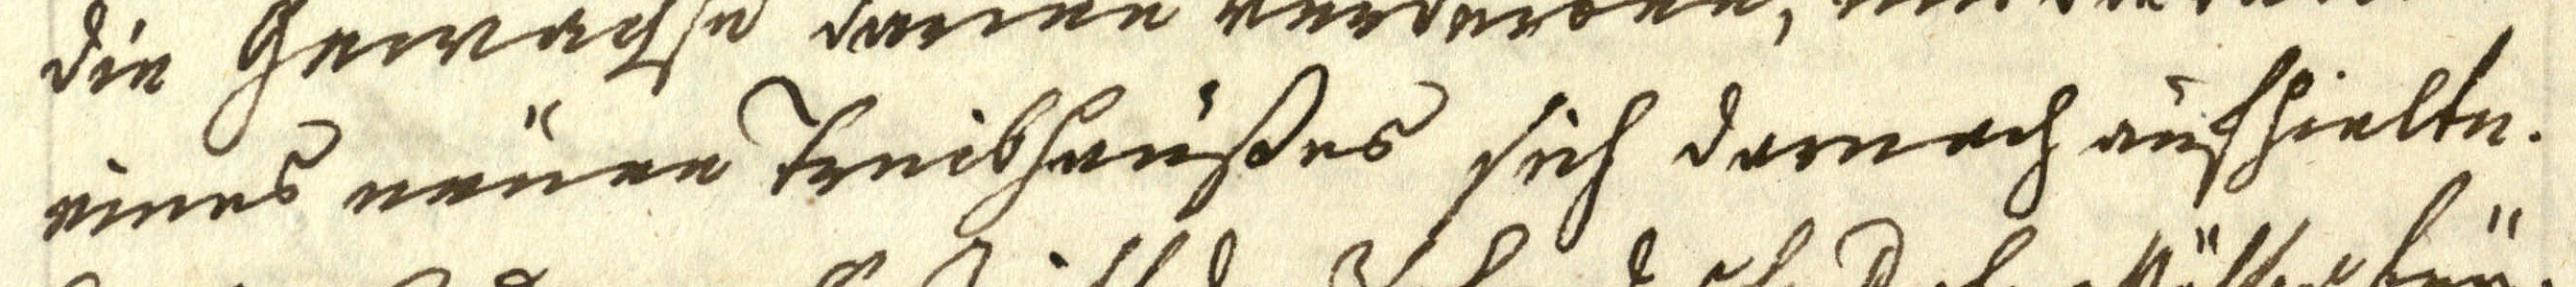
eines neuen Treibhaußes sich darnach aufhielte.
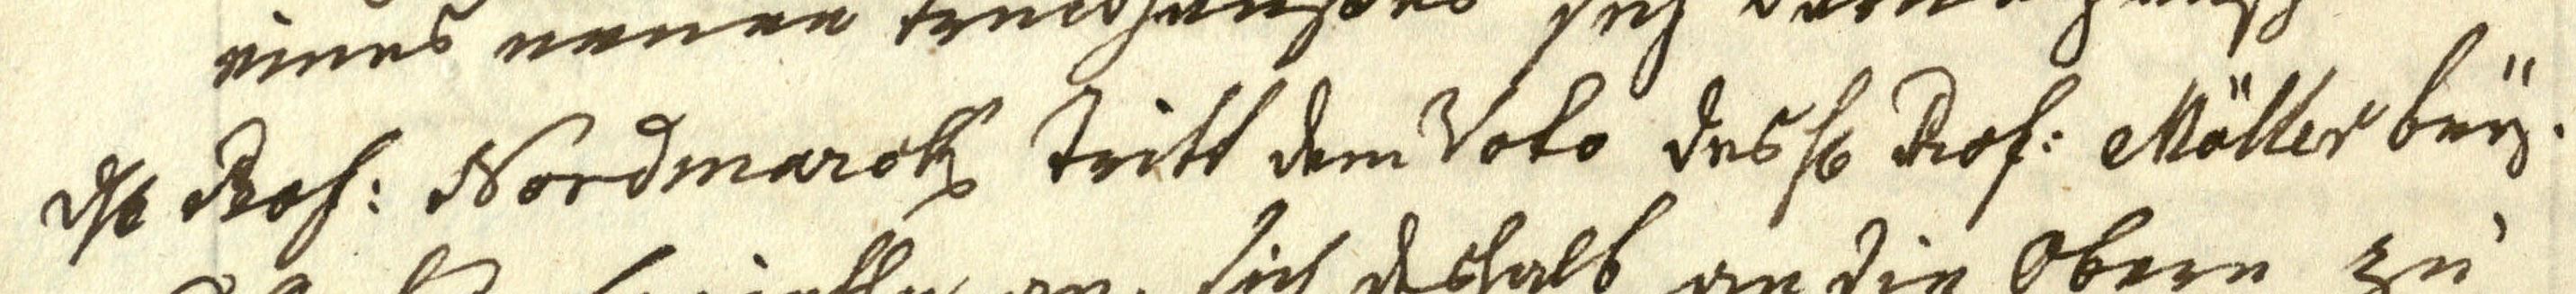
dh Prof. Nordmarck tritt dem Voto des h. Prof. Möller beÿ.
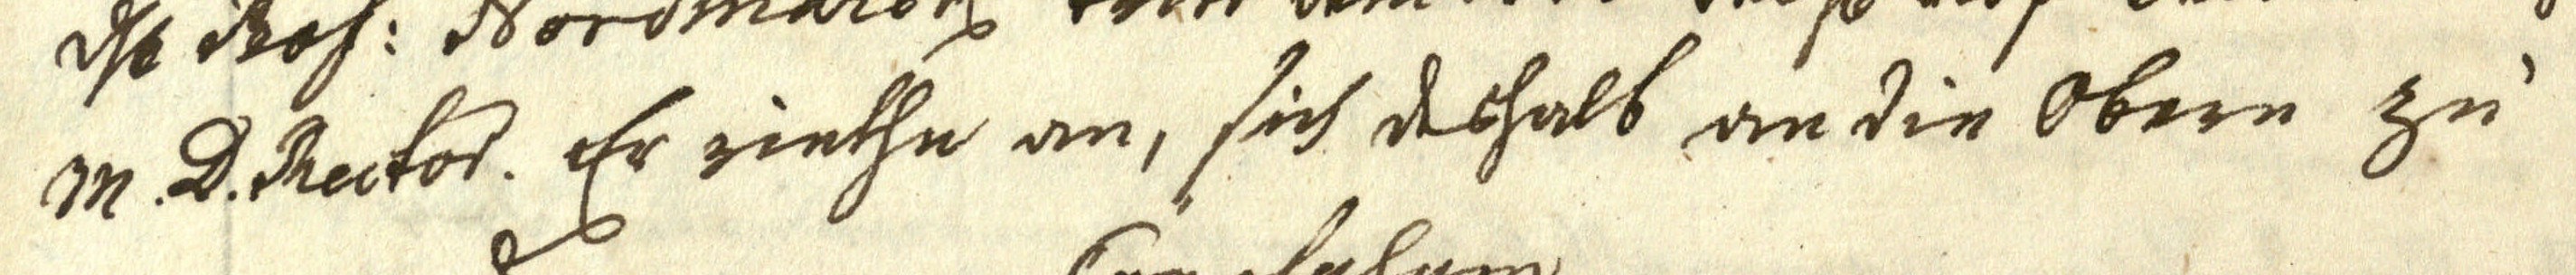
M. D. Rector. Er riethe an, sich deshalb an die Obern zu
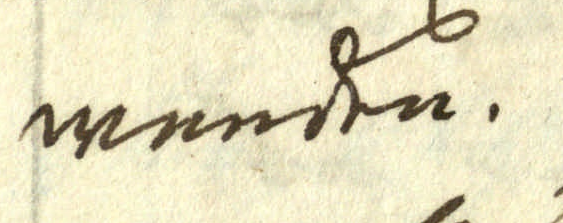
wenden.
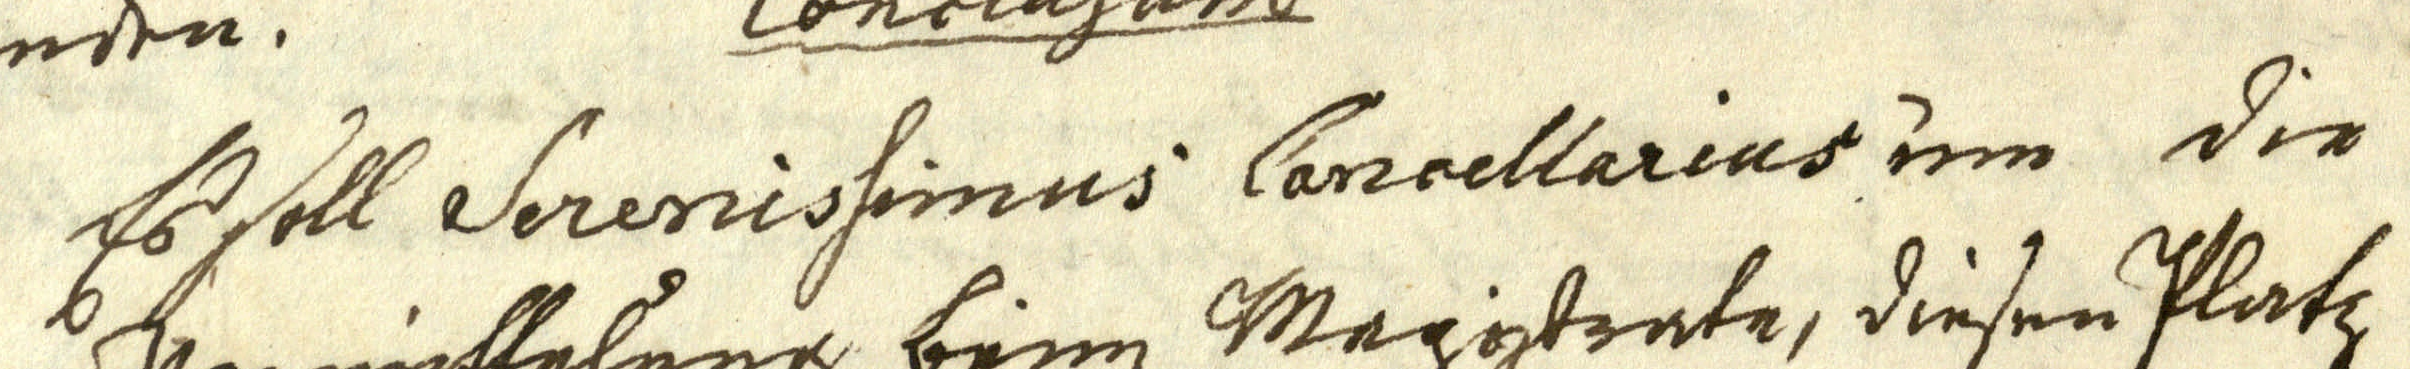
Es soll Serenissimus Cancellarius um die
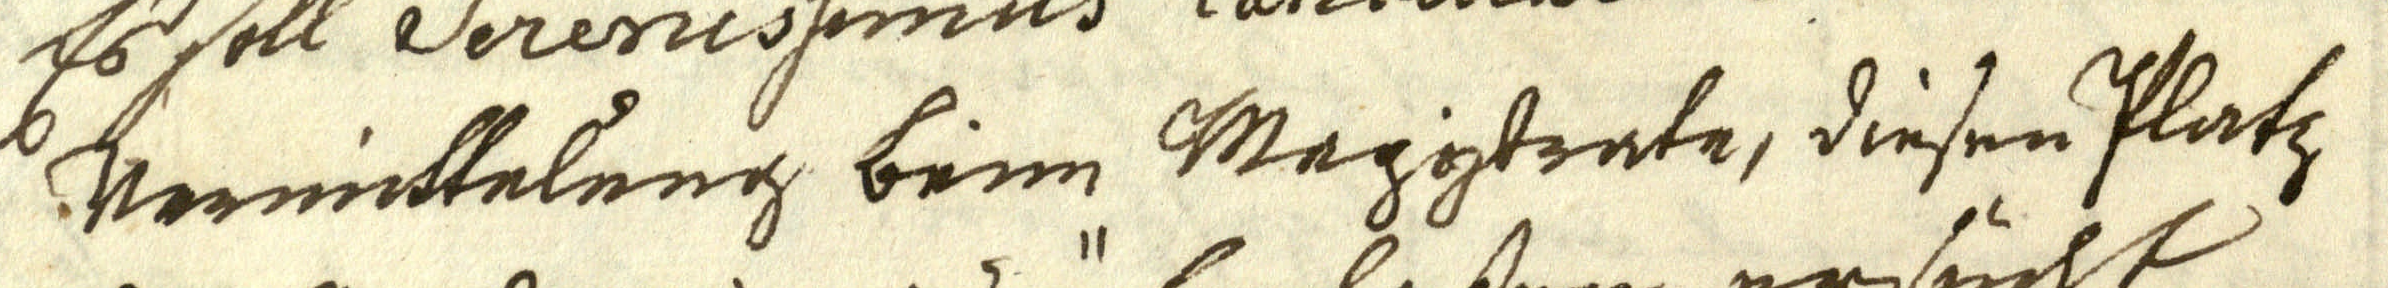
Vermittelung beim Magistrate, diesen Platz
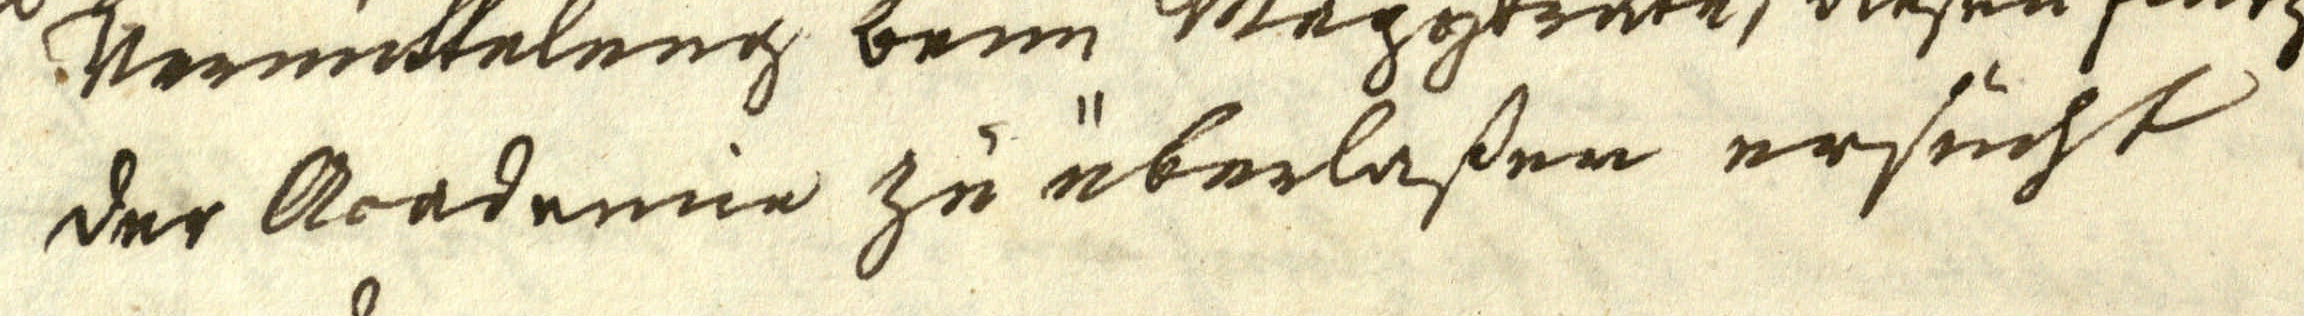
der Academie zu überlaßen ersucht
